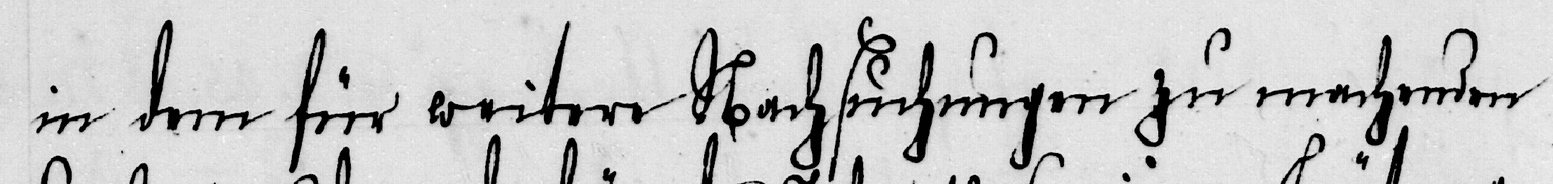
in dem für weitere Nachsuchungen zu machenden
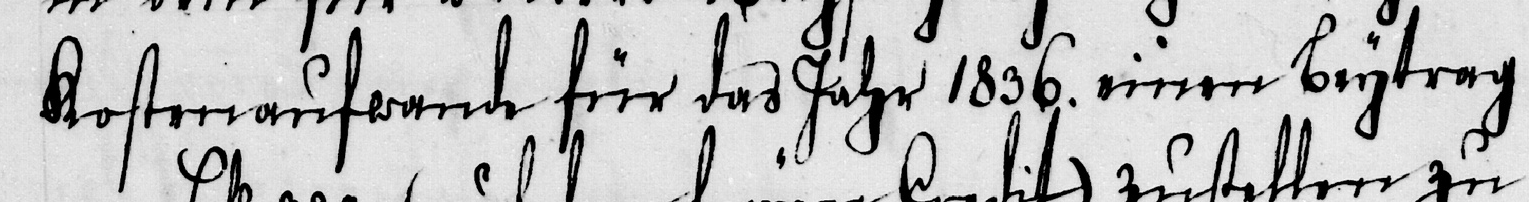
Kostenaufwande für das Jahr 1836. einen Beytrag
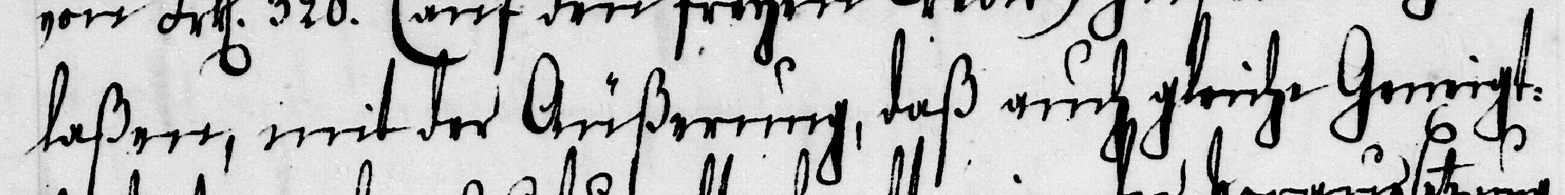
laßen, mit der Äusserung, daß auch gleiche Geneigt¬
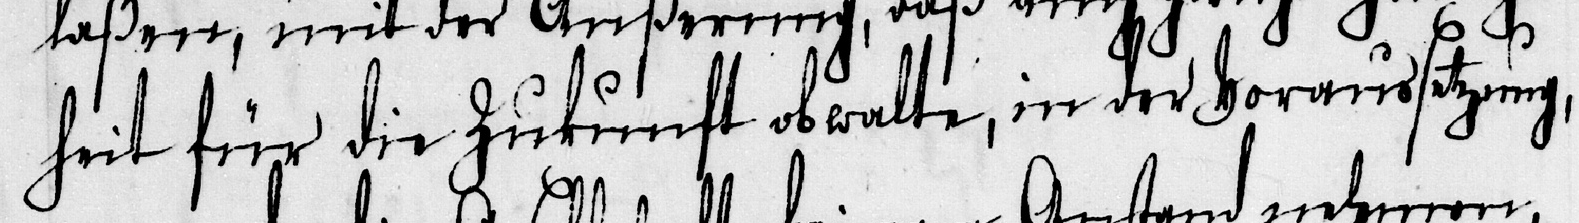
heit für die Zukunft obwalte, in der Voraussetzung,
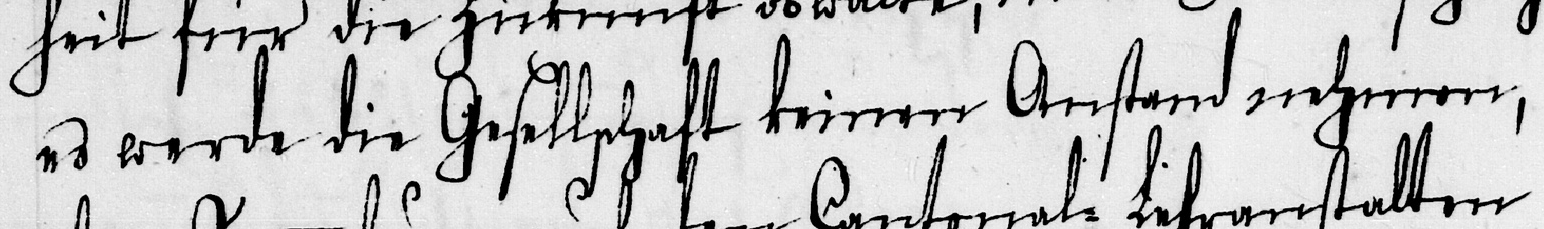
es werde die Gesellschaft keinen Anstand nehmen,
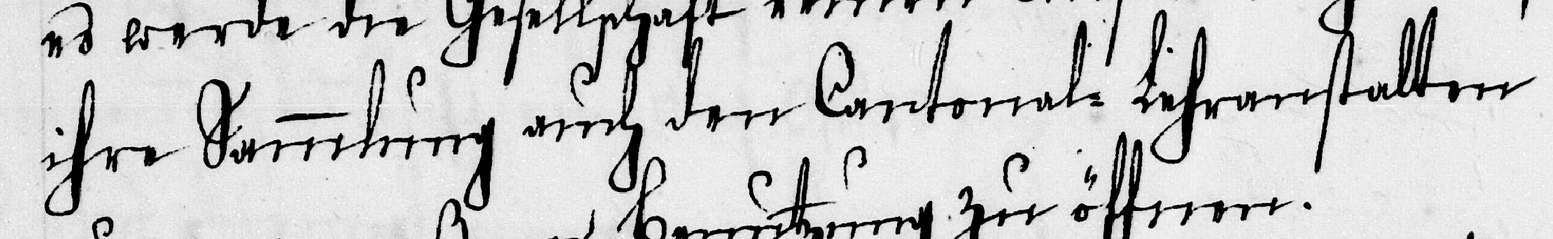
ihre Sammlung auch den Cantonal-Lehranstalten
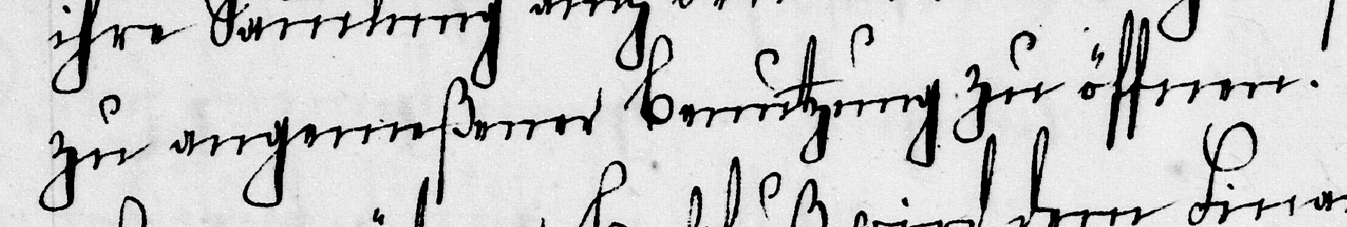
zu angemeßener Benutzung zu öffnen.
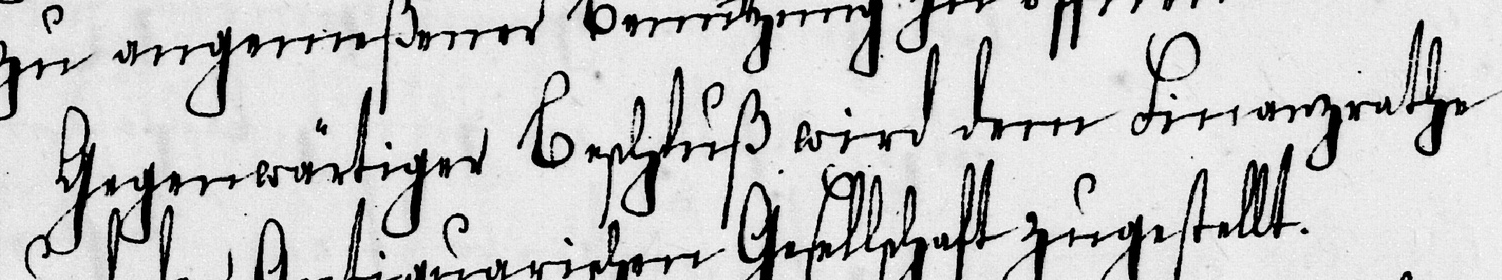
Gegenwärtiger Beschluß wird dem Finanzrathe
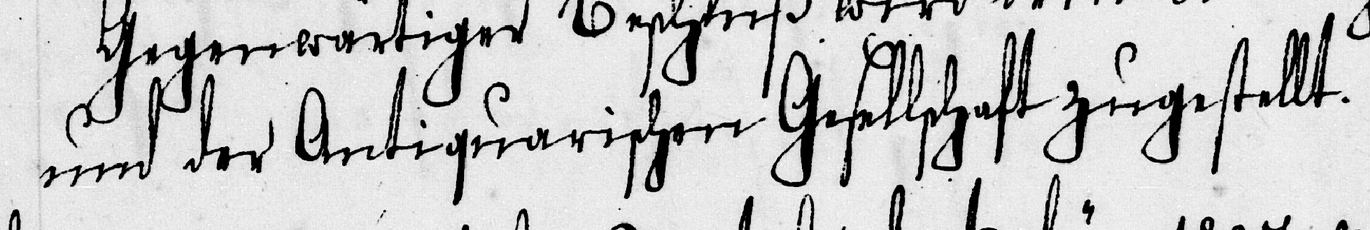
und der Antiquarischen Gesellschaft zugestellt.
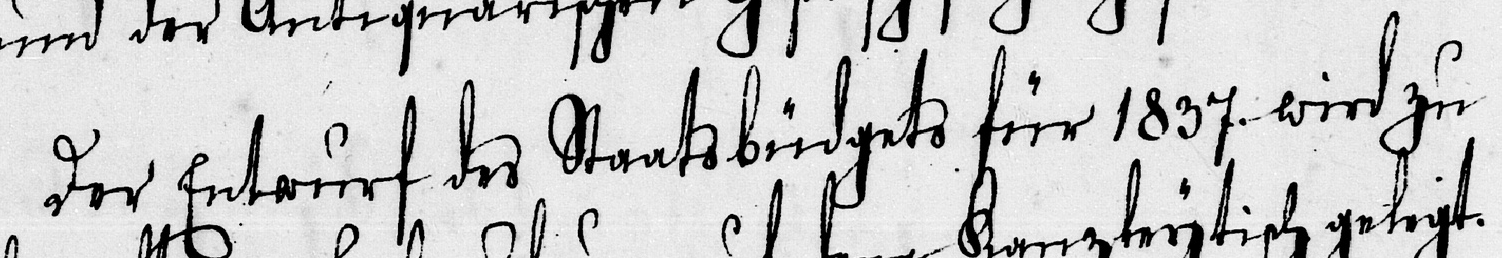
Der Entwurf des Staatsbüdgets für 1837. wird zu
